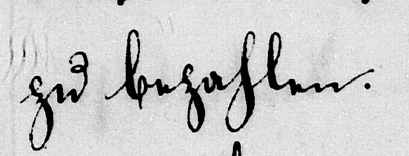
zu bezahlen.
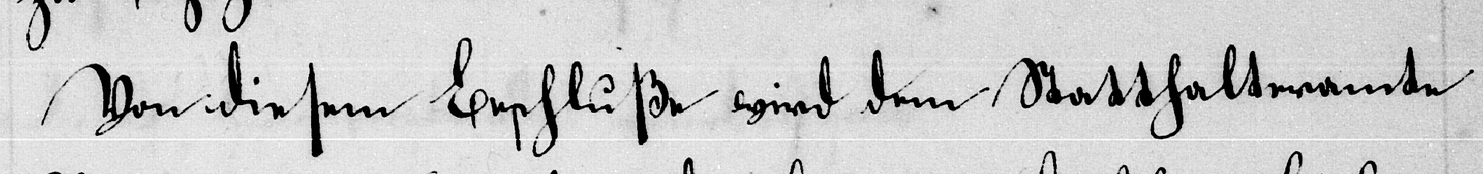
Von diesem Beschluße wird dem Statthalteramte
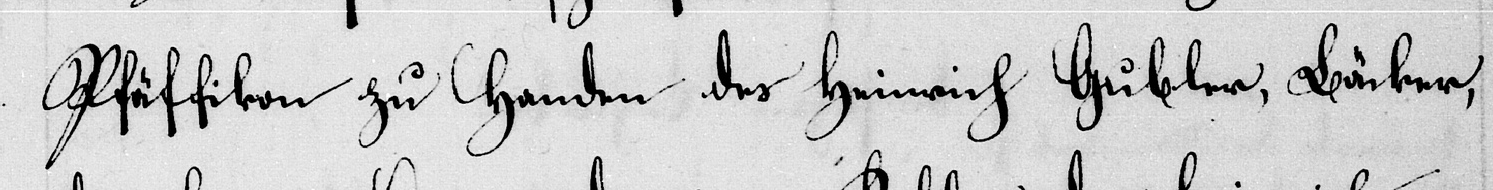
Pfäffikon zu Handen des Heinrich Gubler, Bäcker,
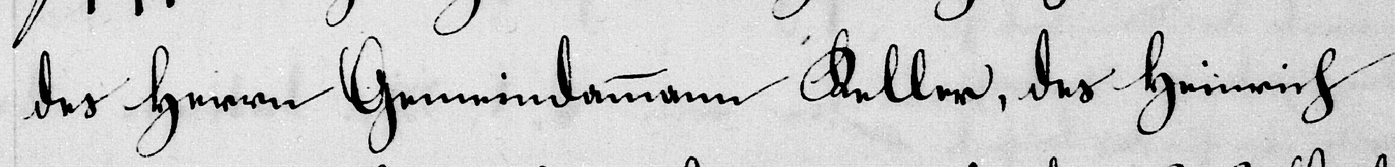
des Herrn Gemeindeammann Keller, des Heinrich
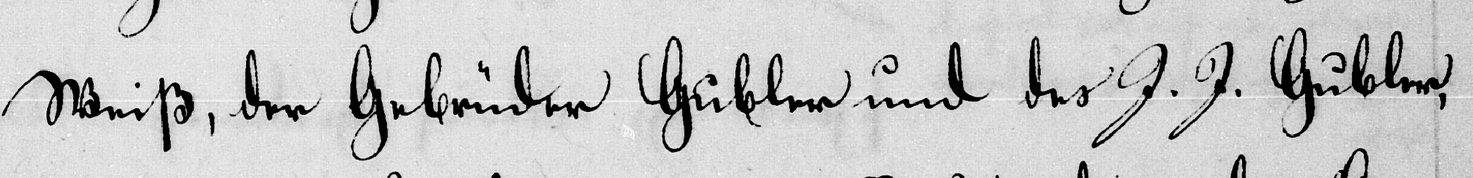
Meiß, der Gebrüder Gubler und des J. J. Gubler,
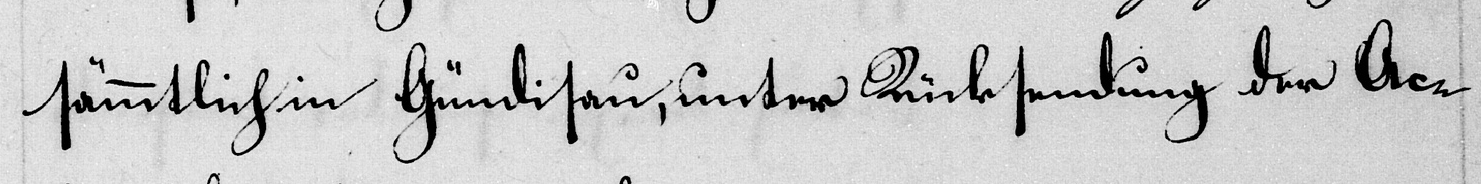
sämmtlich in Gündisau, unter Rücksendung der Ac¬
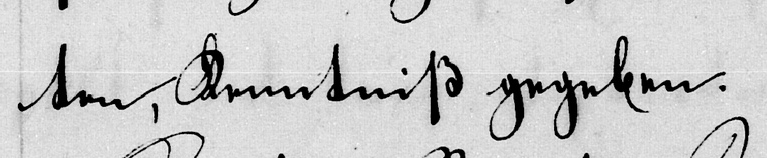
ten, Kenntniß gegeben.
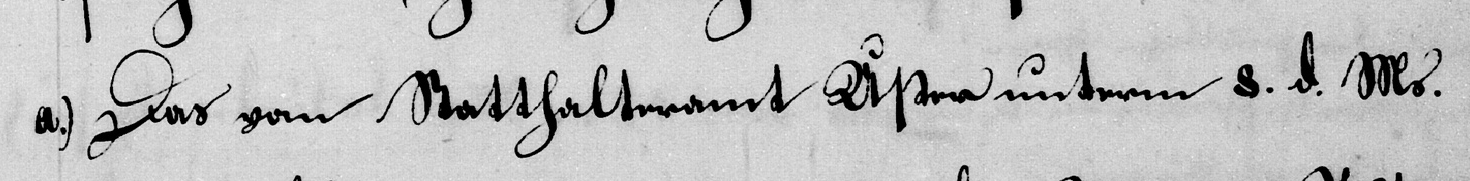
a.) Das vom Statthalteramt Uster unterm 8. d. Ms.
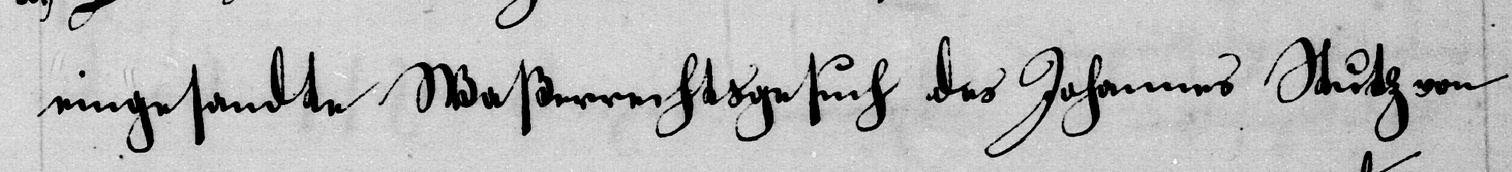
eingesandte Waßerrechtsgesuch des Johannes Stutz von
